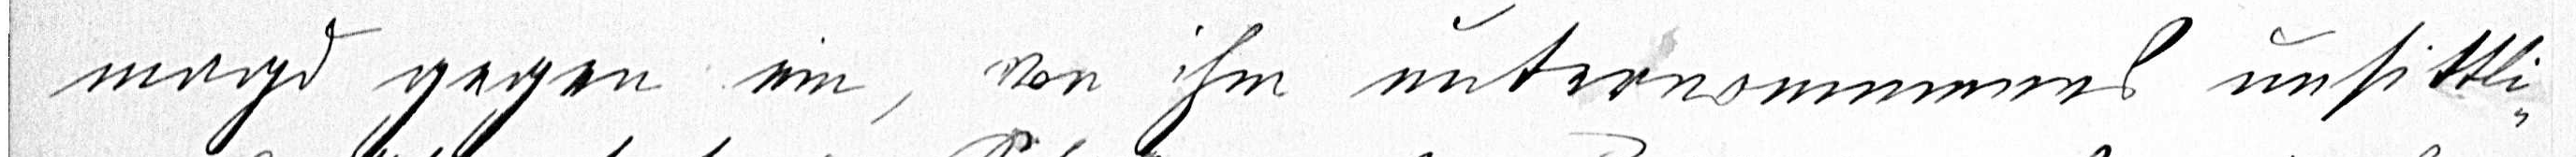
magd gegen ein, von ihm unternommenes unsittli¬
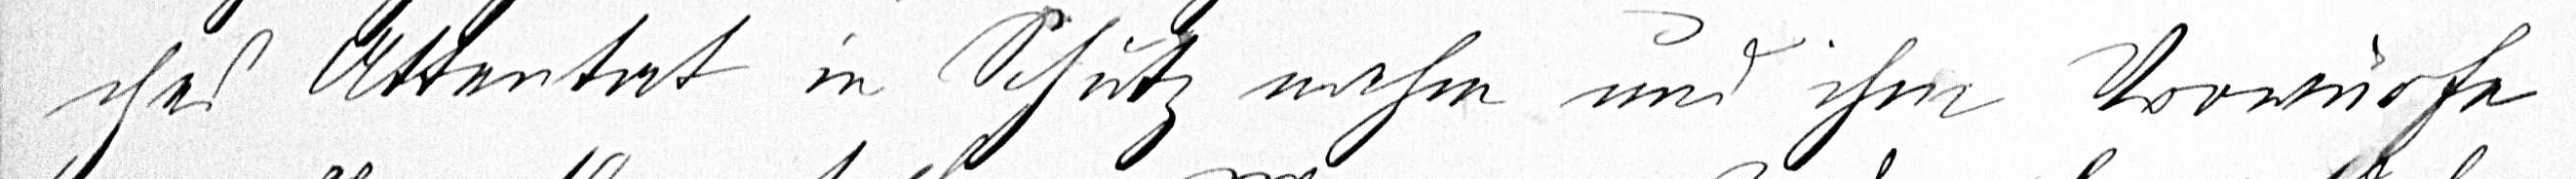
ches Attentat in Schutz nahm und ihm Vorwürfe
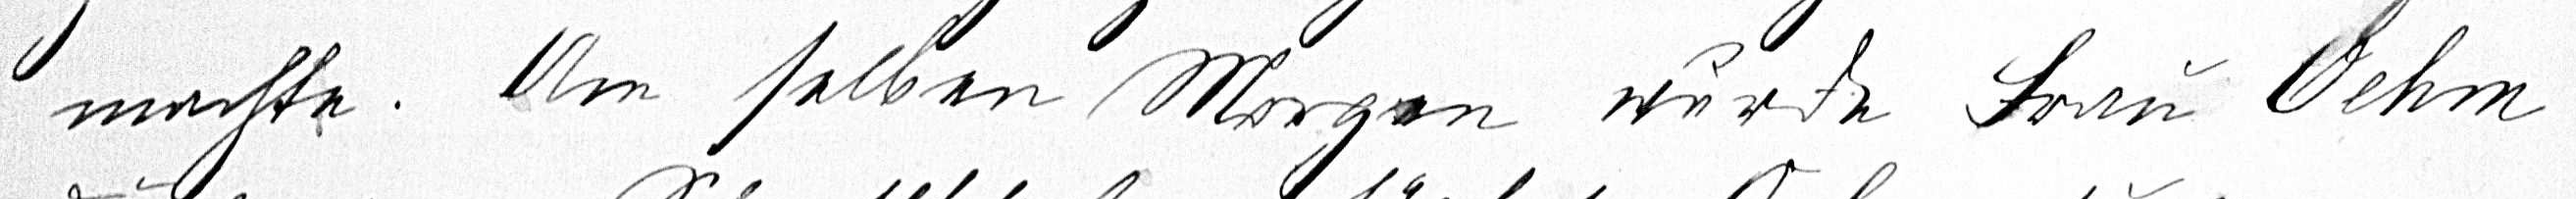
machte. Um selben Morgen wurde Frau Oehm
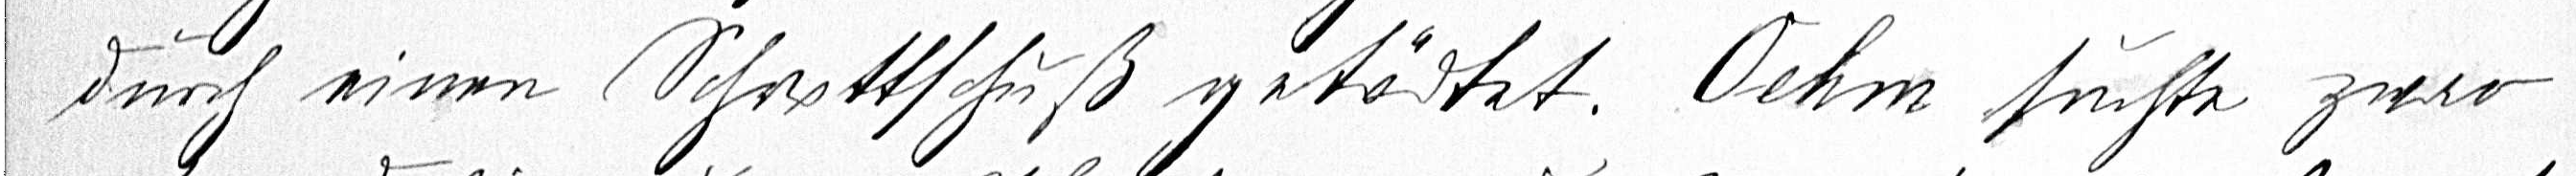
durch einen Schrottchuß getödtet. Oehm suchte zwar
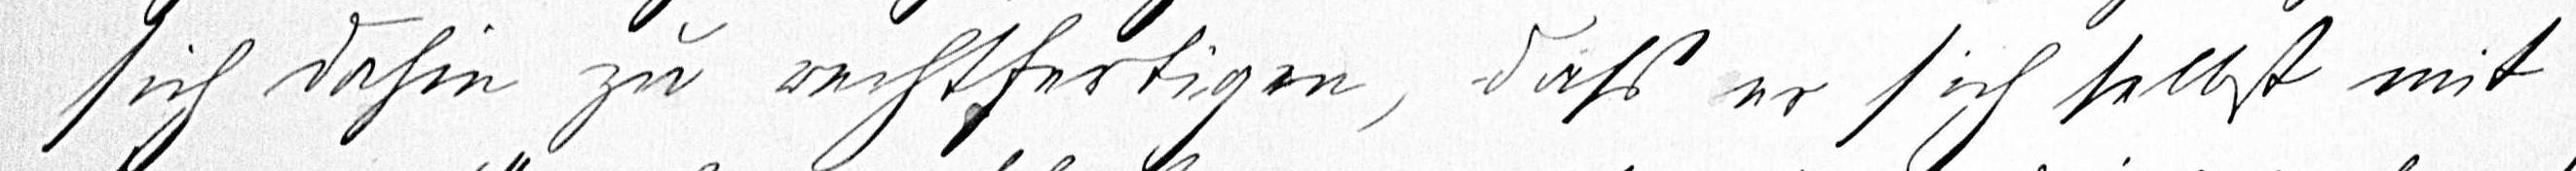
sich dahin zu rechtfertigen, dass er sich selbst mit
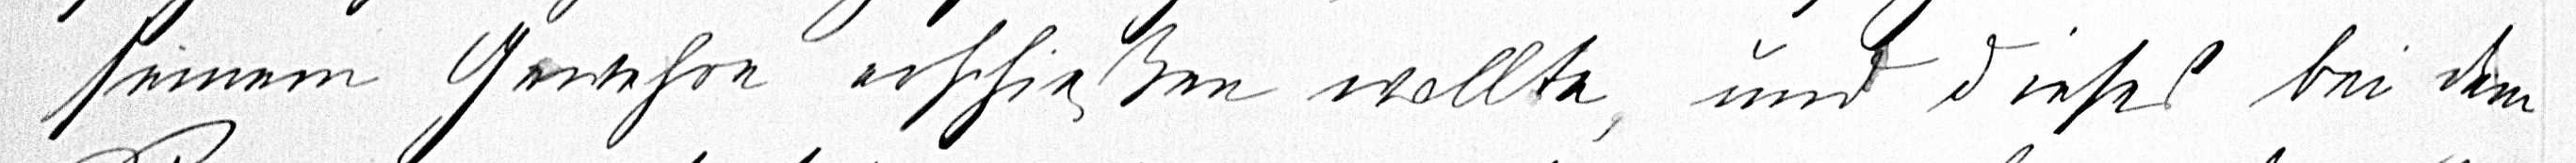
seinem Gewehre erschießen wollte, und dieses bei dem
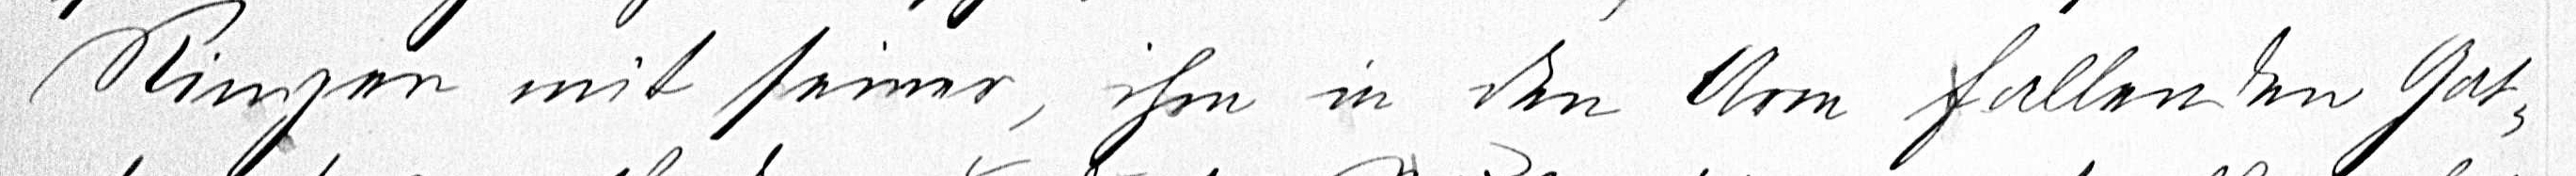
Ringen mit seiner, ihm in den xx fallenden Gat¬
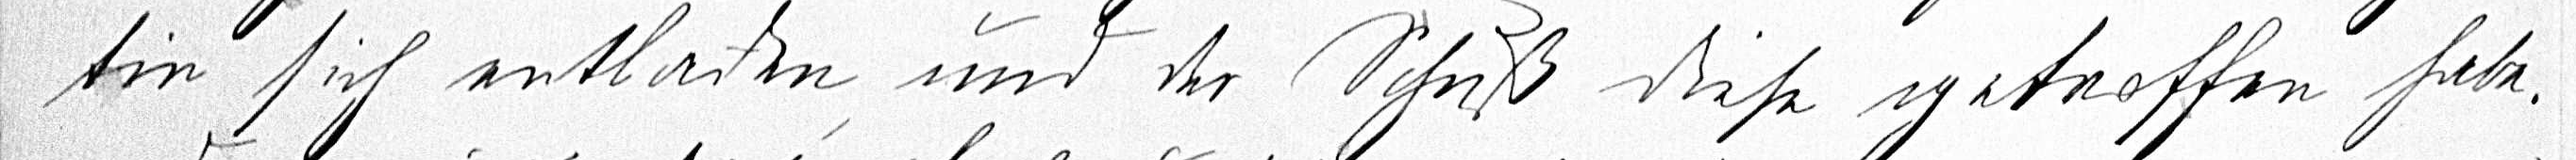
tin sich entladen, und der Schuß diese getroffen habe.
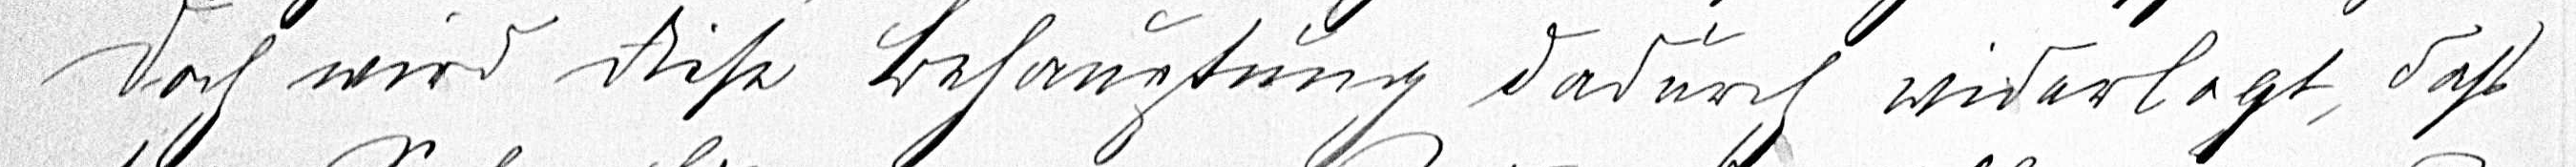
Doch wird diese Behauptung dadurch widerlegt, dass
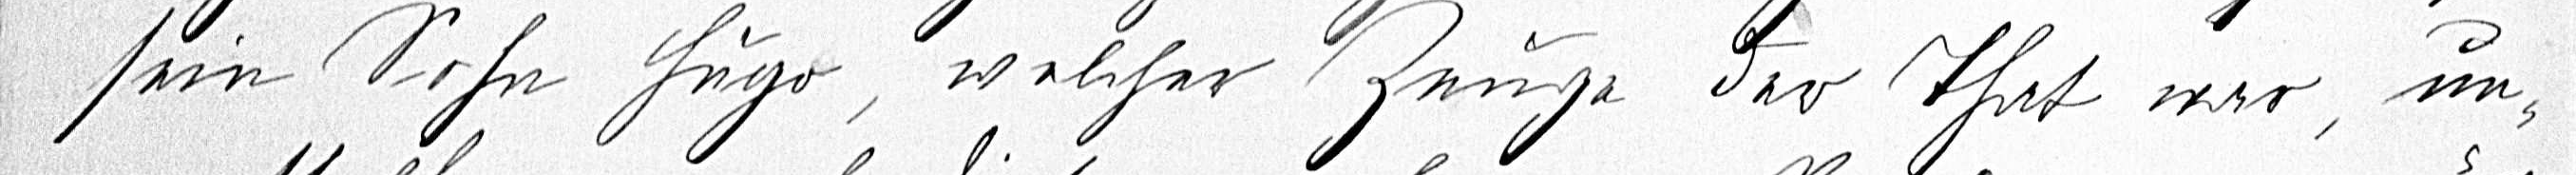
sein Sohn Hugo, welcher Zeuge der That war, un¬
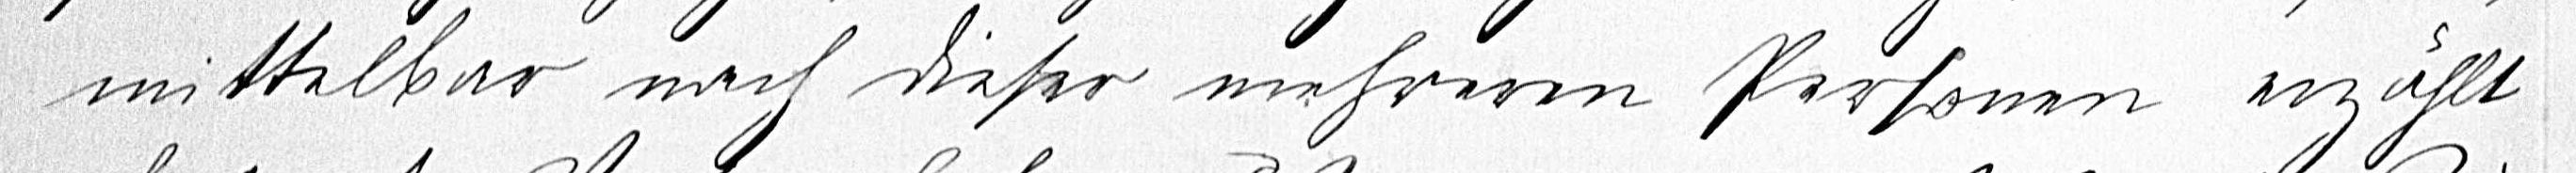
mittelbar nach dieser mehreren Personen erzählt
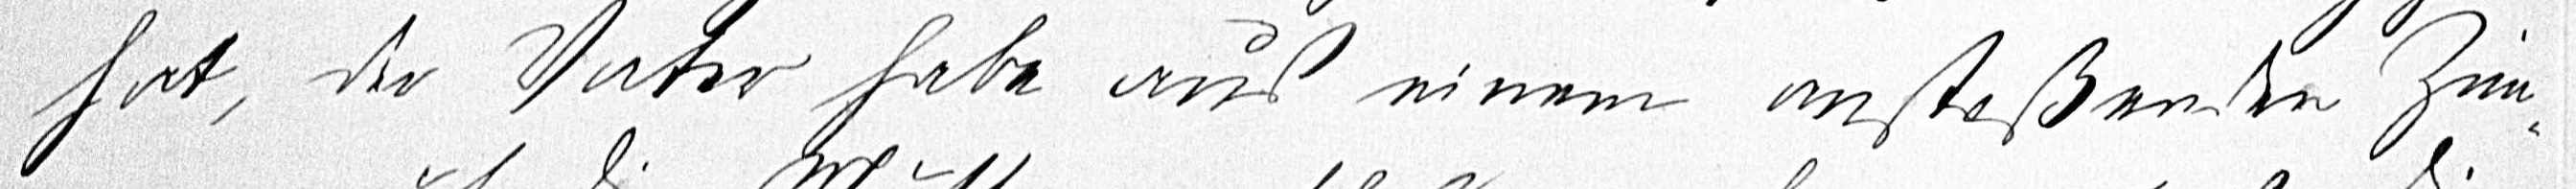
hat, der Vater habe aus einem anstoßenden Zim¬
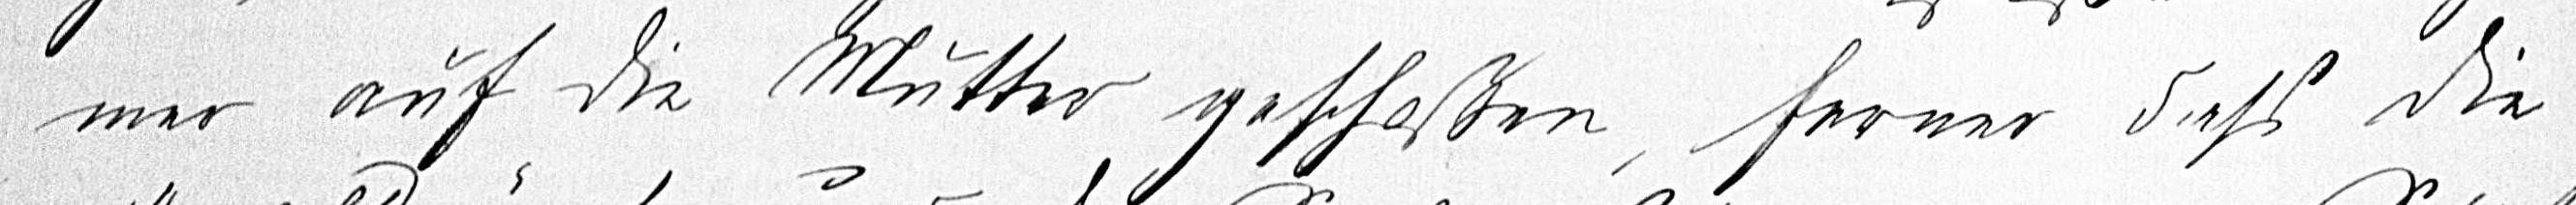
mer auf die Mutter geschoßen, ferner dass die
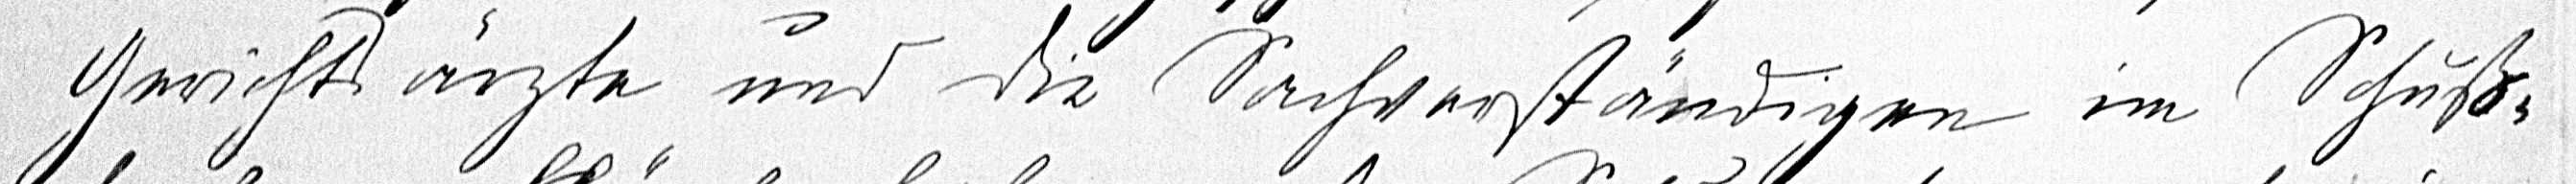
Gerichts ärzte und die Sachverständigen im Schuß¬
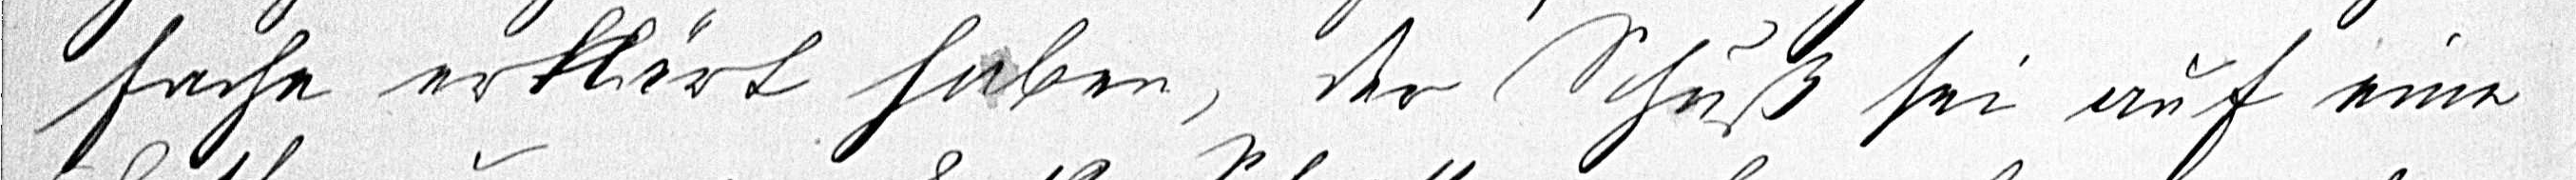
sache erklärt haben, der Schuß sei auf eine
